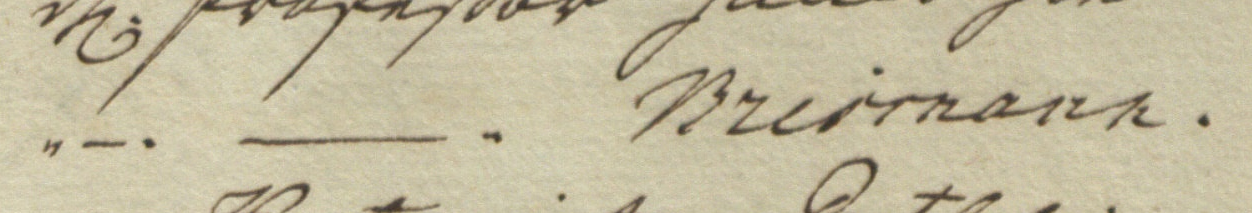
Brismann.
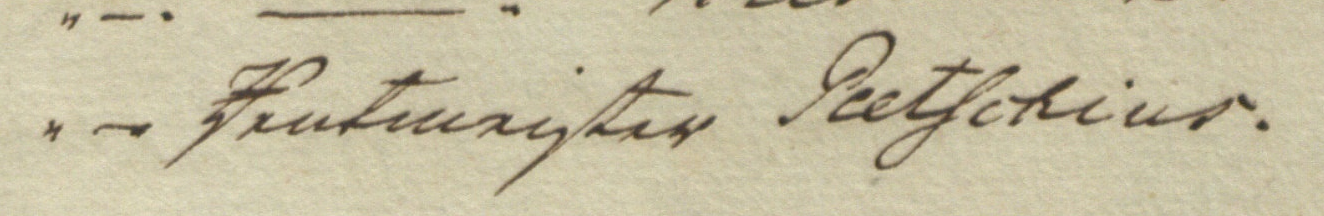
Rentmeister Peetschius.
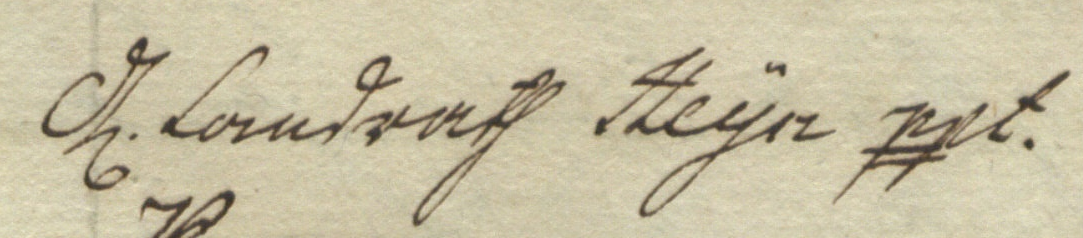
dh. Landrath Heÿn ppt.
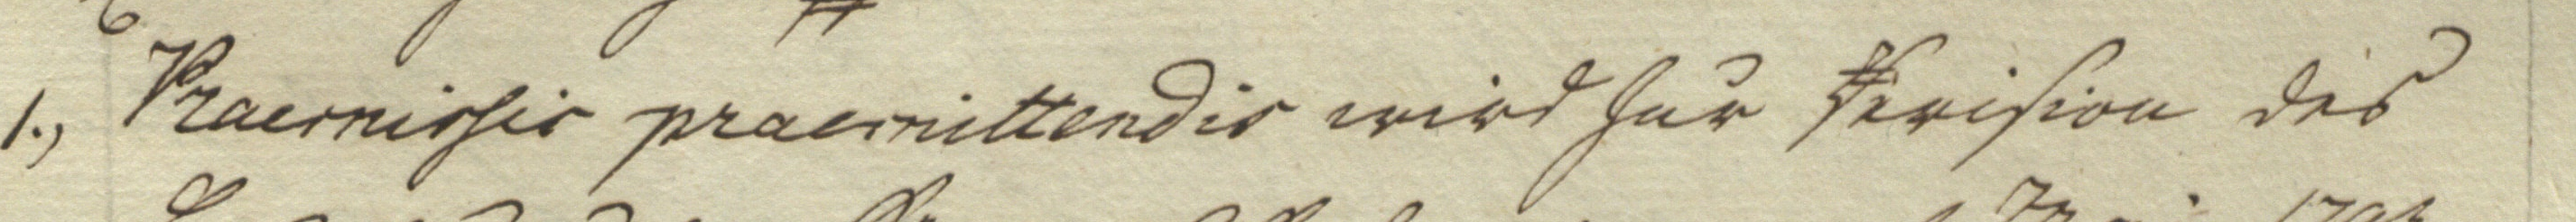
1., Praemissis praemittendis wird zur Revision des
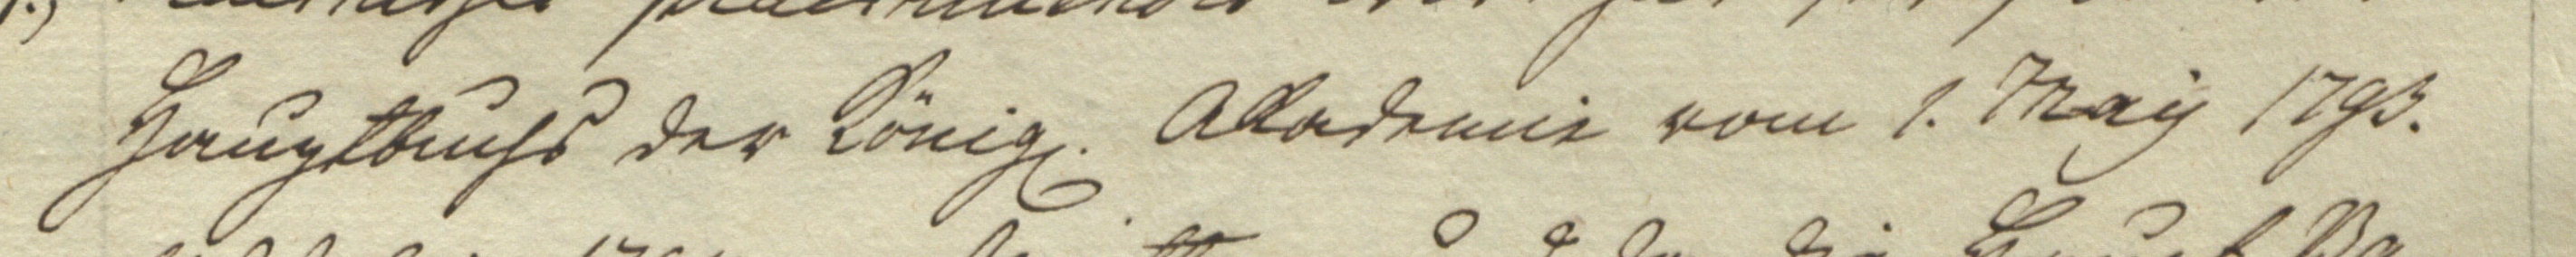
Hauptbuchs der Königl. Akademie vom 1. Maÿ 1793.
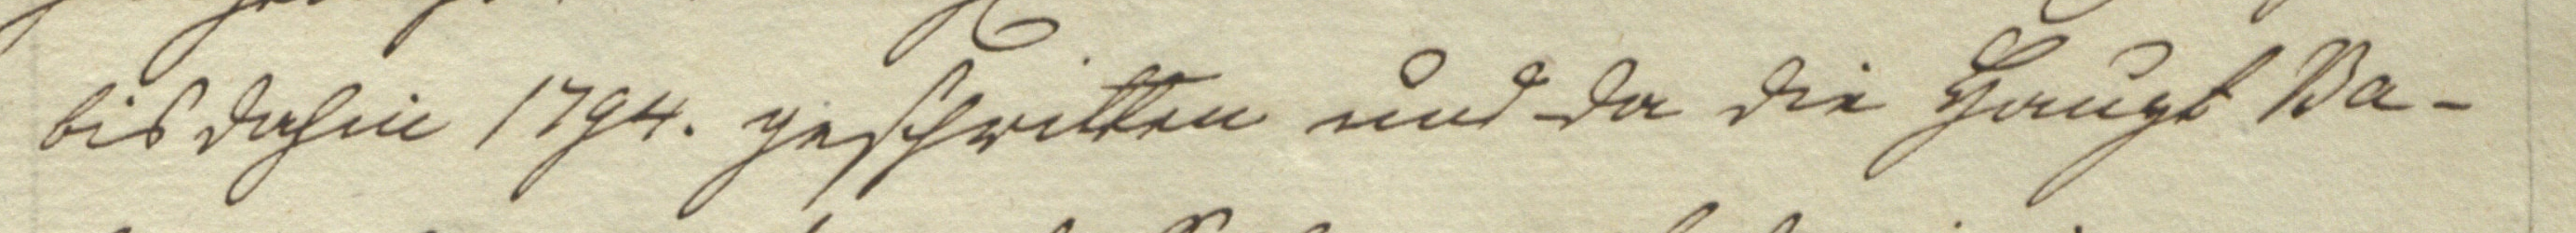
bis dahin 1794. geschritten und da die Haupt Ba¬
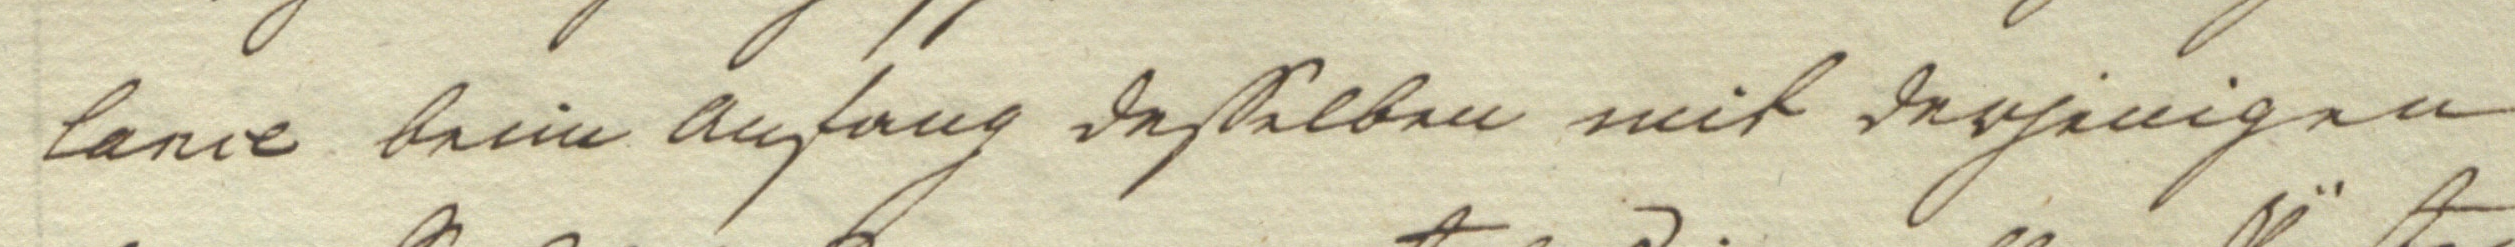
lance beim Anfang desselben mit derjenigen
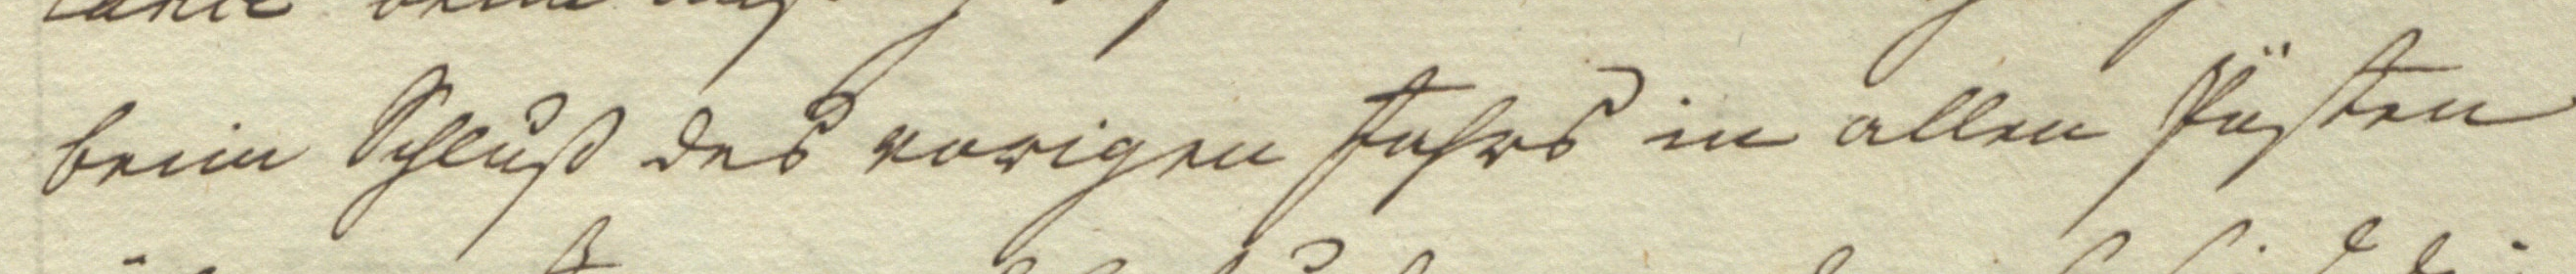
beim Schluß des vorigen Jahrs in allen Püsten
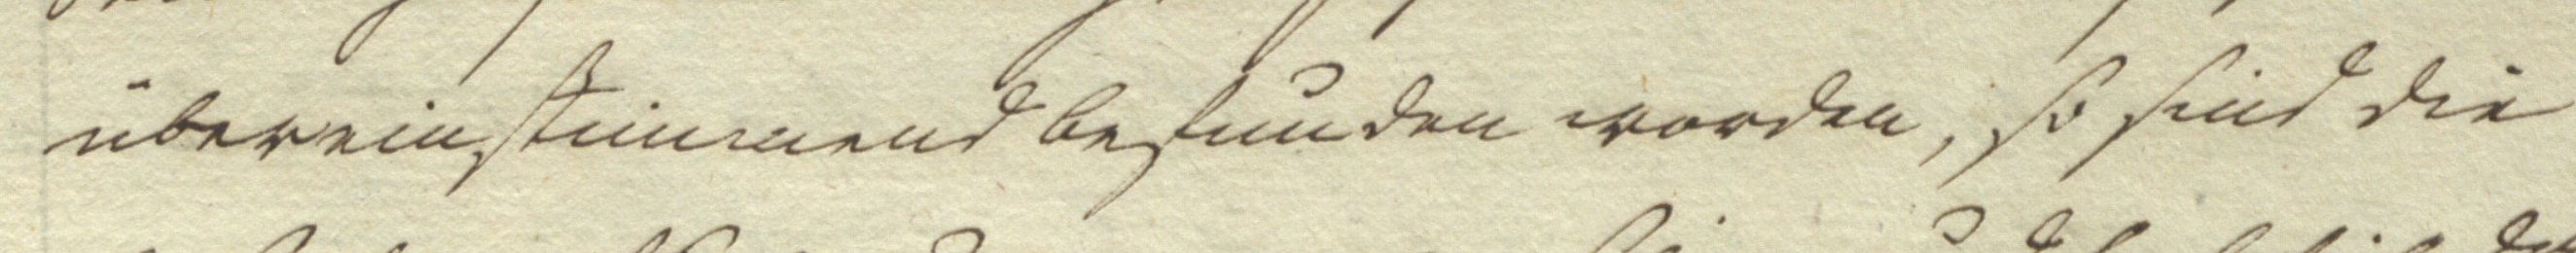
überenstimmend befunden worden, so sind die
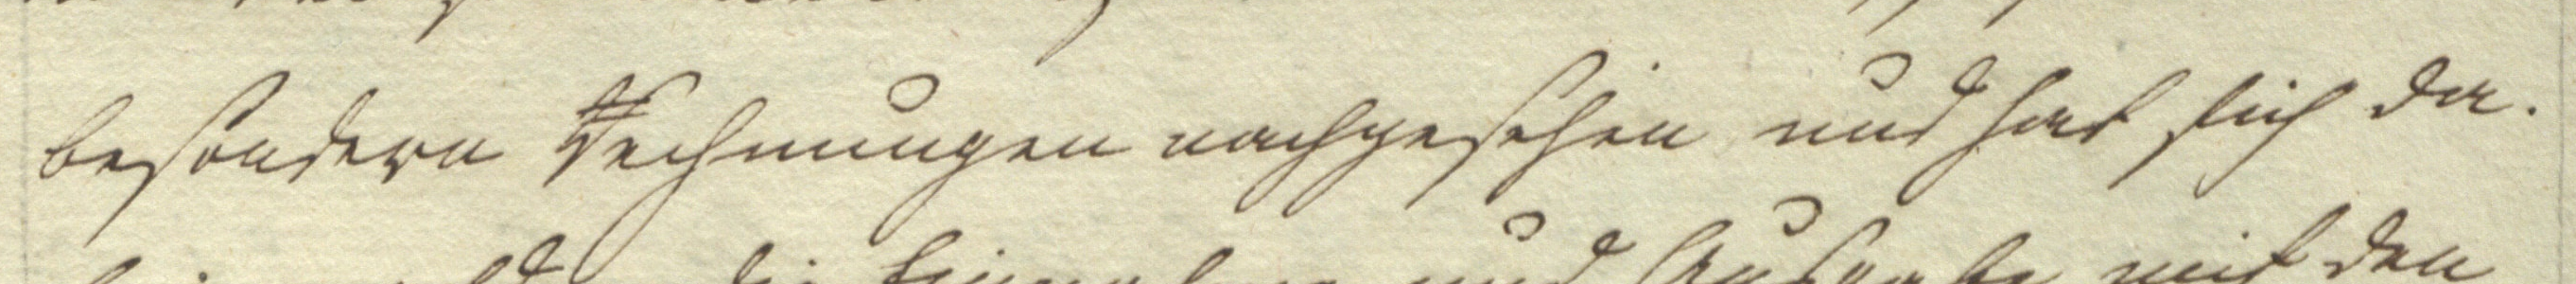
besondern Rechnungen nachgesehen und hat sich da¬
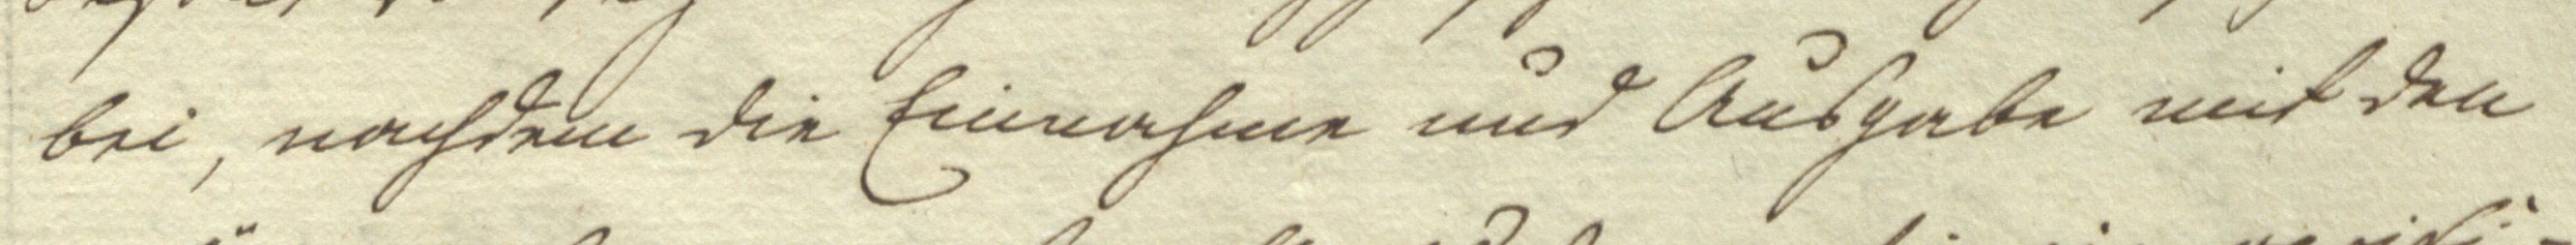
bei, nachdem die Einnahme und Ausgabe mit den
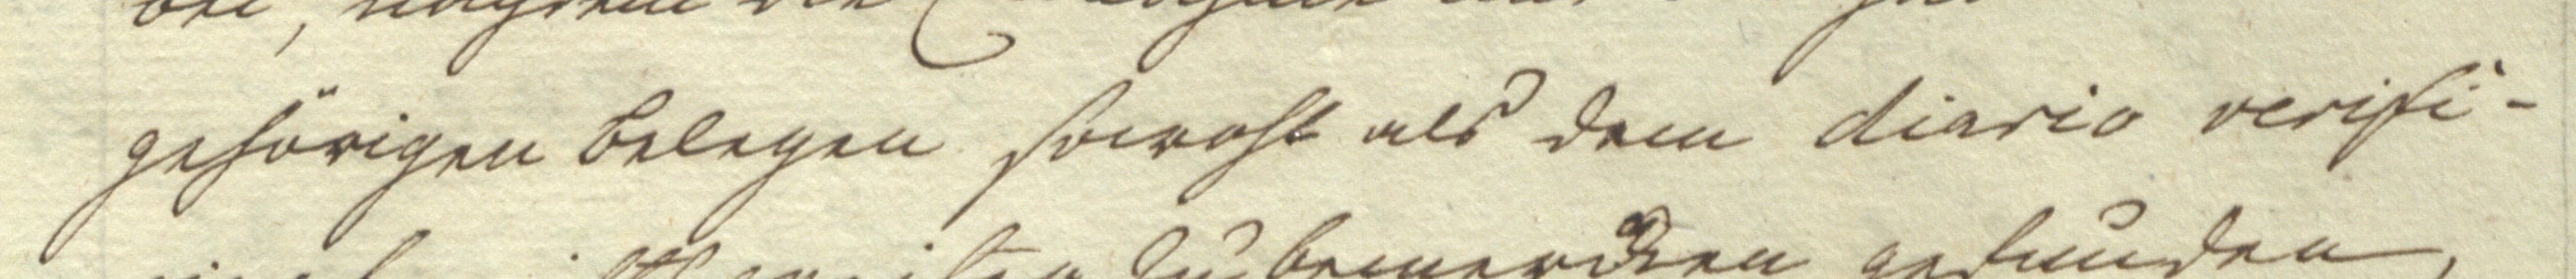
gehörigen Belegen sowohl als dem diario verifi-
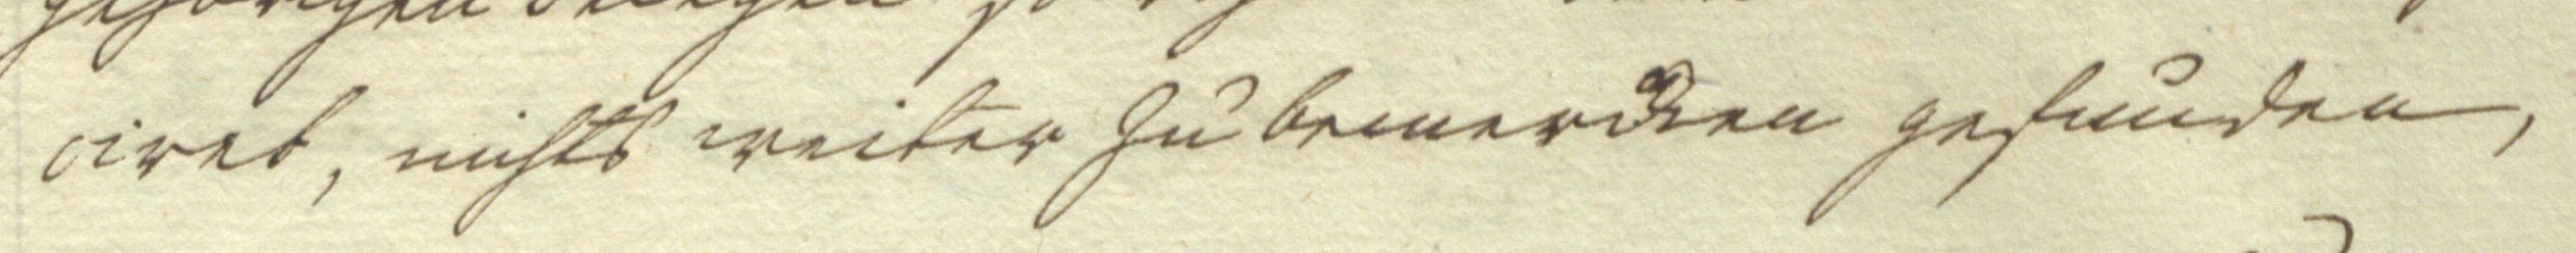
ciret, nicht weiter zu bemercken gefunden,
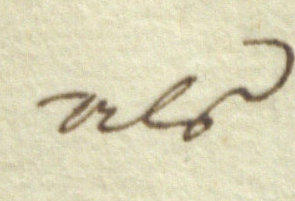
als
